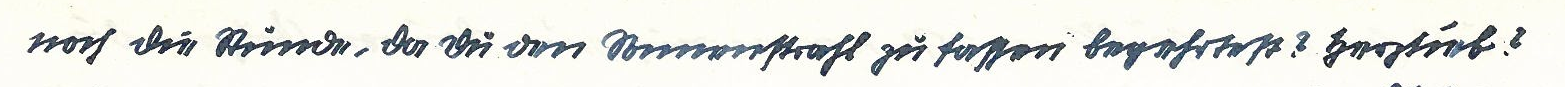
noch die Stunde, da Du den Sonnenstrahl zu fassen begehrtest? Herzlieb?
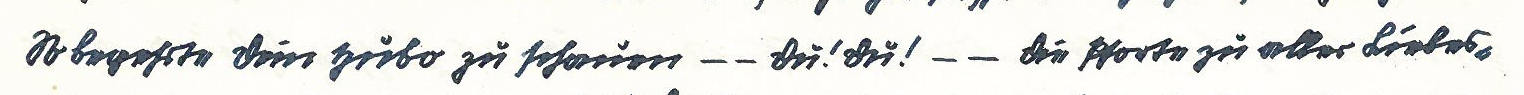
So begehrte Dein Hubo zu schauen – – Du! Du! – – die Pforte zu aller Liebes¬
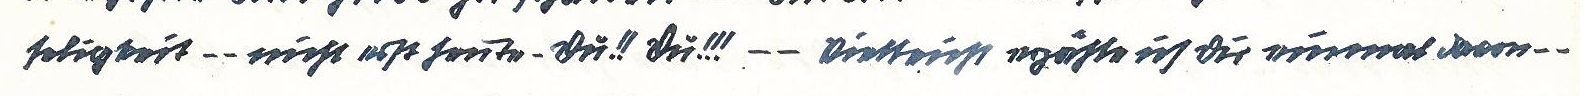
seligkeit – – nicht erst heute – Du!! Du!!! – – Vielleicht erzähle ich Dir einmal davon – –
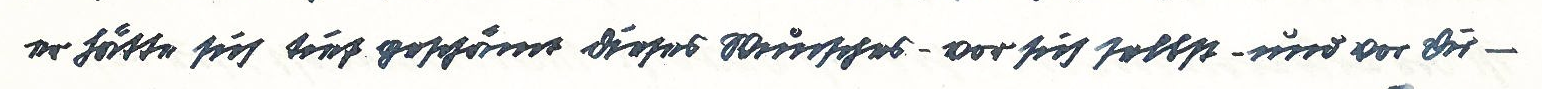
er hätte sich tief geschämt dieses Wunsches – vor sich selbst – und vor Dir –
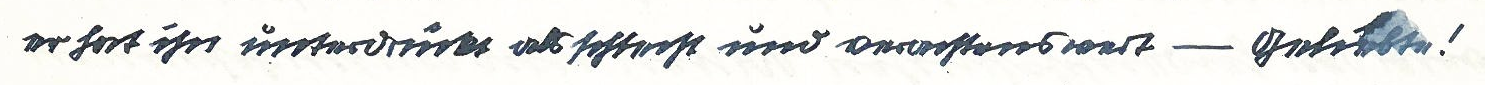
er hat ihn unterdrückt als schlecht und verachtenswert – Geliebte!
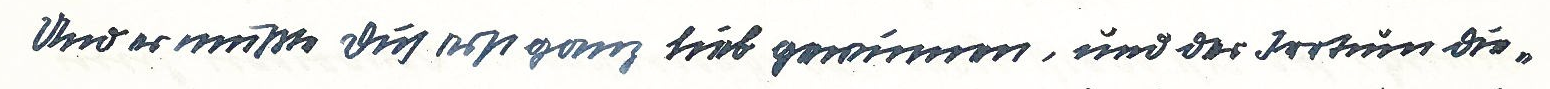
Und er mußte Dich erst ganz lieb gewinnen, und der Irrtum die¬
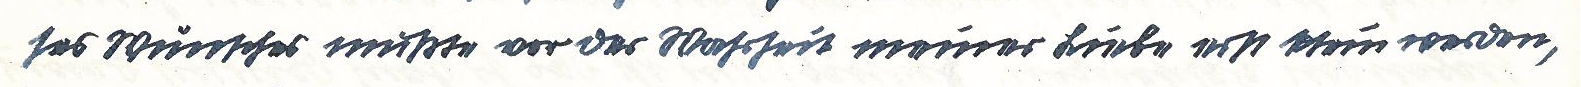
ses Wunsches mußte vor der Wahrheit meiner Liebe erst klein werden,
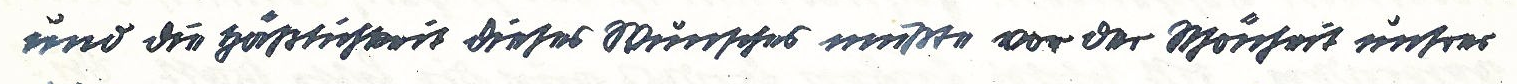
und die Häßlichkeit dieses Wunsches mußte vor der Schönheit unsrer
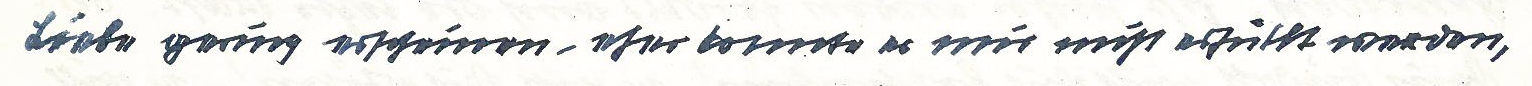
Liebe gering erscheinen, eher konnte er mir nicht erfüllt werden,
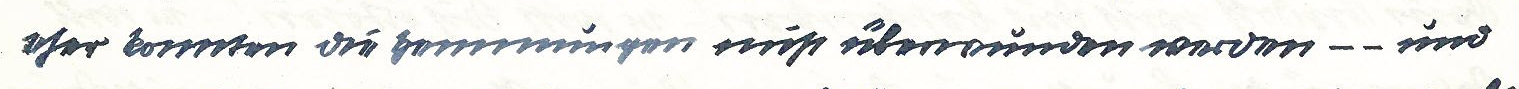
eher konnten die Hemmungen nicht überwunden werden – – und
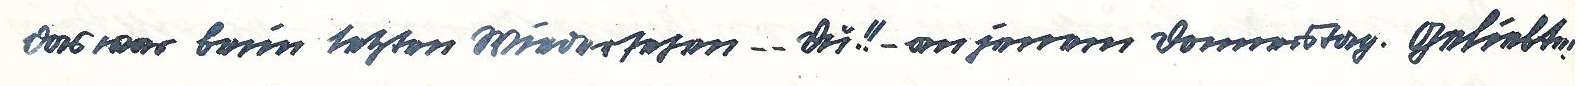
das war beim letzten Wiedersehen – – Du!! – an jenem Donnerstag. Geliebte!
